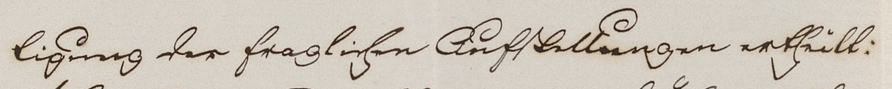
tigung der fraglichen Aufstellungen ertheilt:
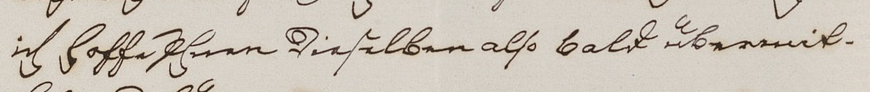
ich hoffe Ihnen dieselben also bald übermit-
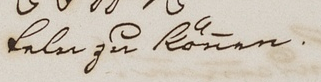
teln zu können.
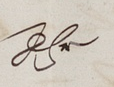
Escher
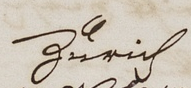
Zürich
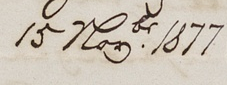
15 Novbr 1877
